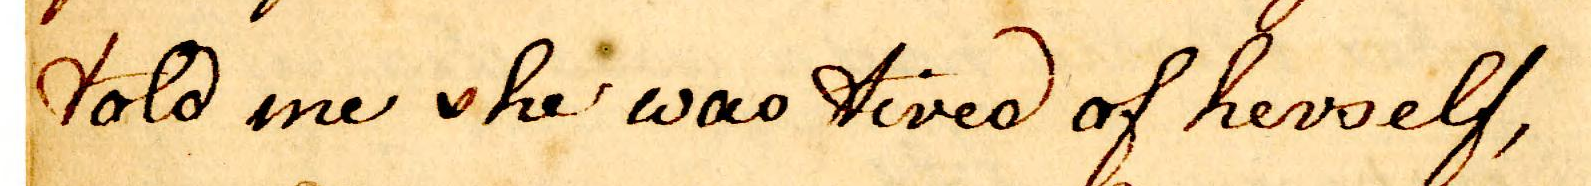told me she was tired of herself,
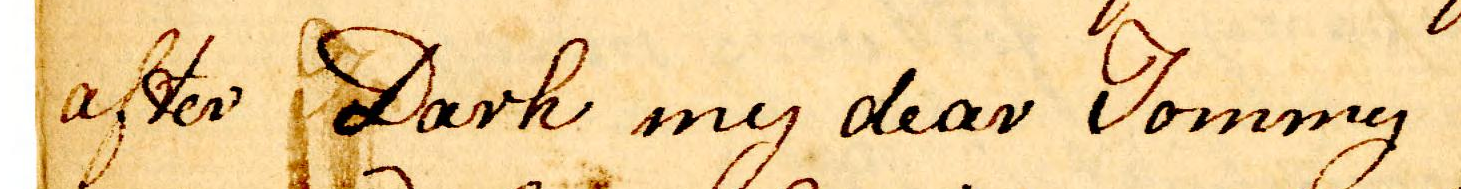after Dark my dear Tommy
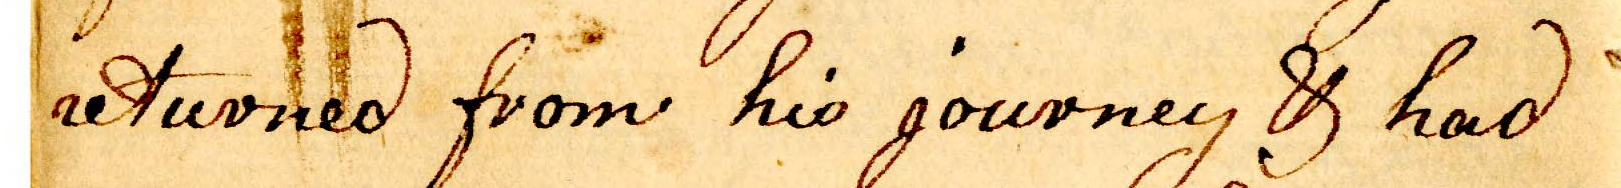returned from his journey & had
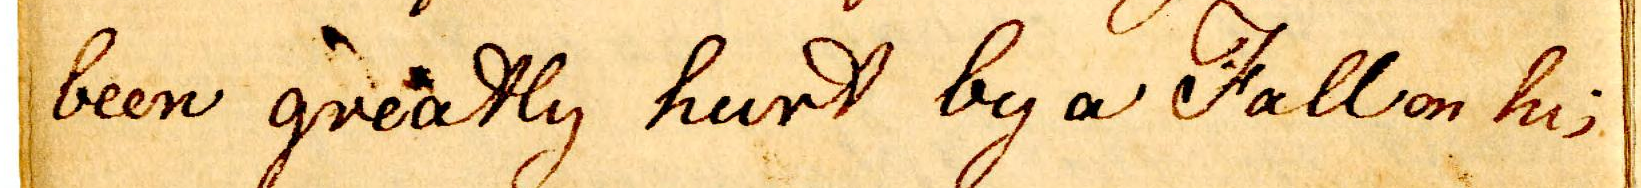been greatly hurt by a Fall on his
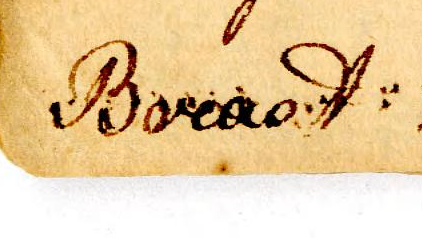Breast
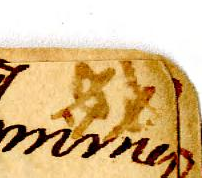41
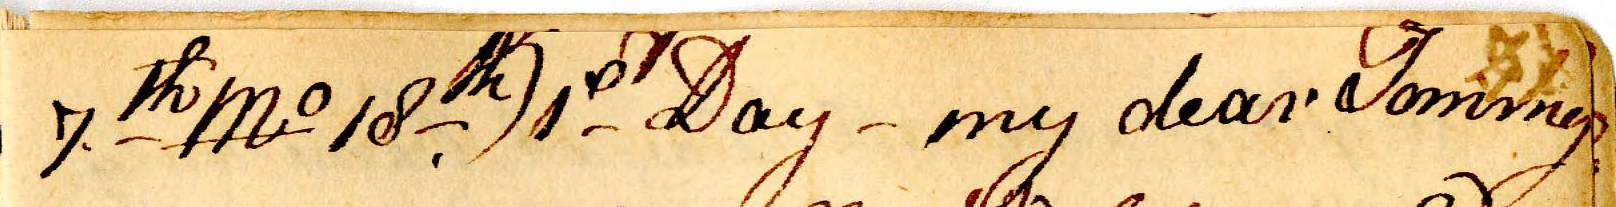7^th M^o 18^th) 1^st Day- my dear Tommy
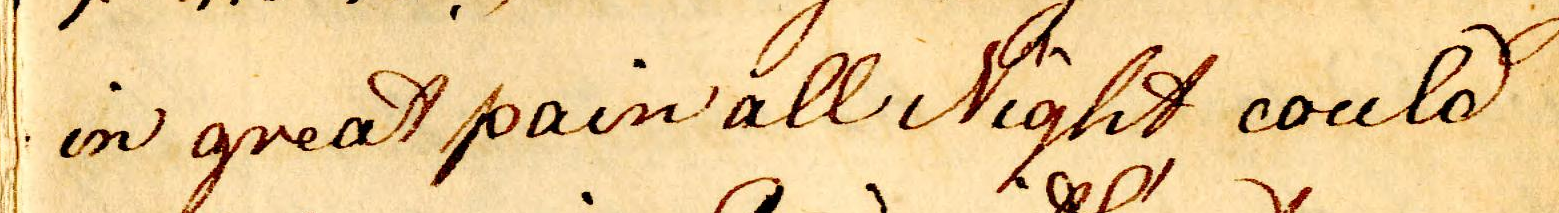in great pain all Night could
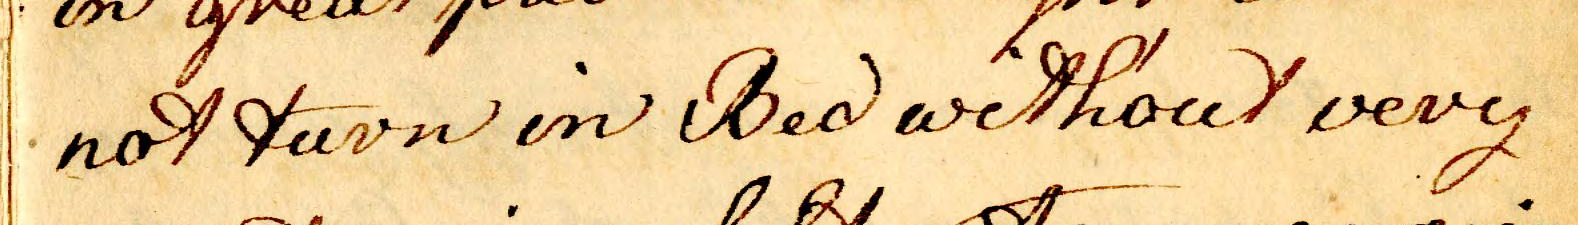not turn in Bed without very
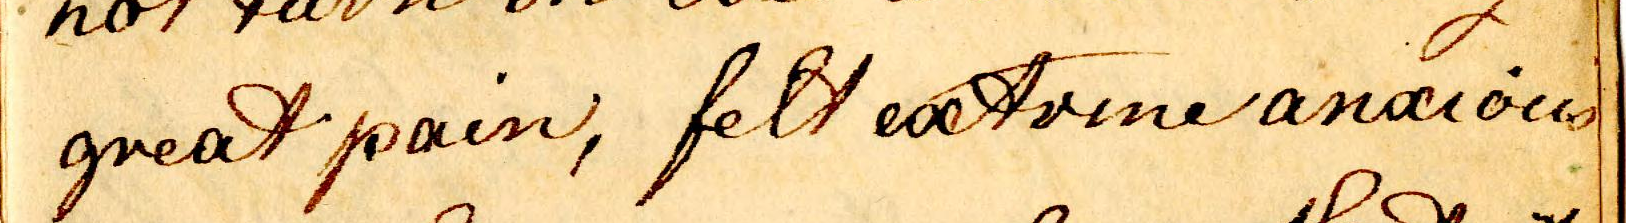great pain, felt extreme anxious
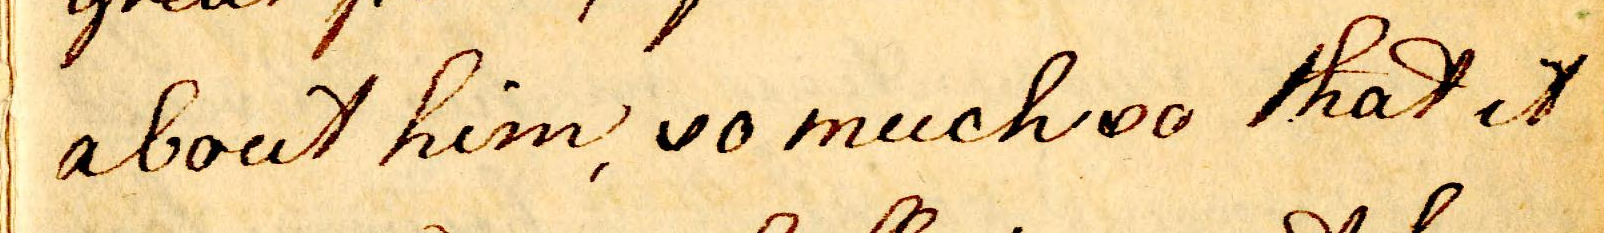about him so much so that it
